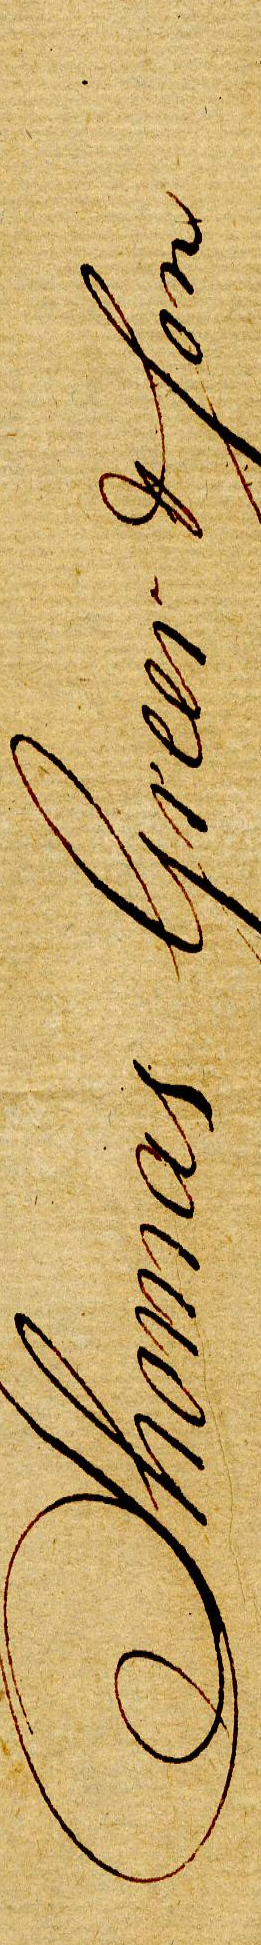Thomas Greer & son
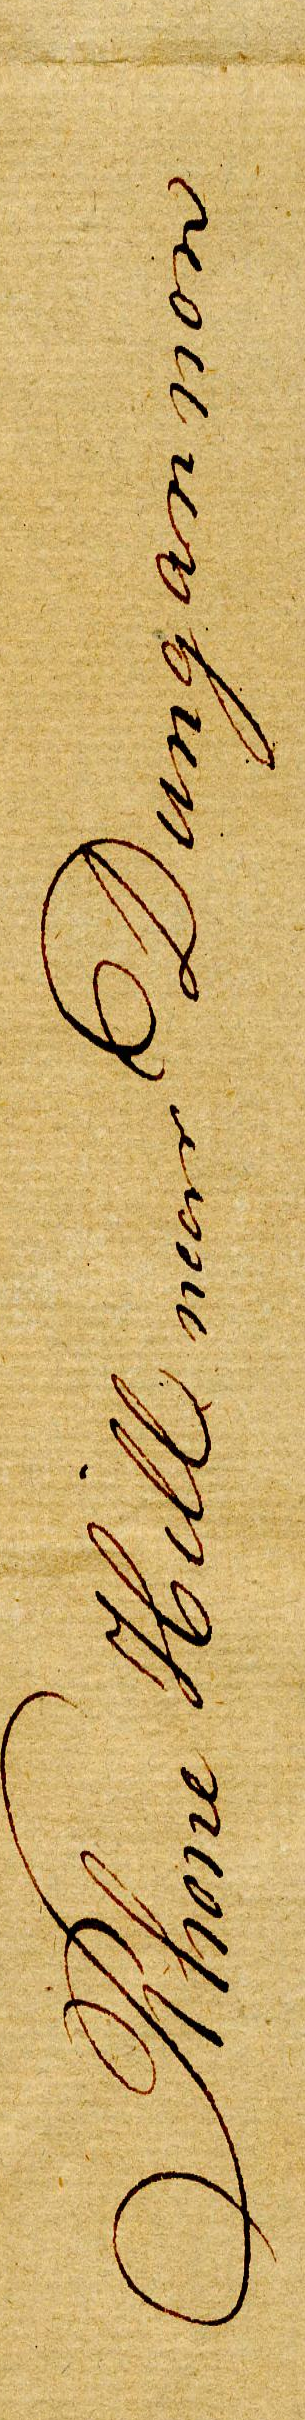Rhone Hill near Dungannon
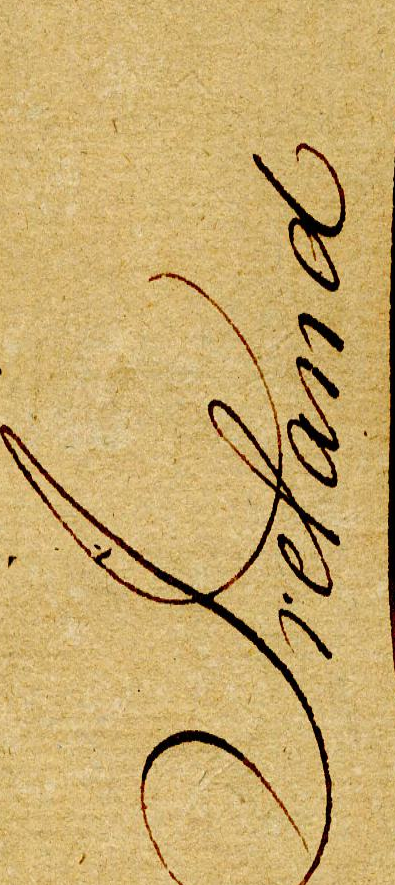Ireland
